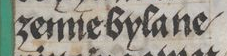zemie byla ne¬
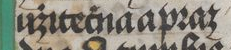użiteċna a praz¬
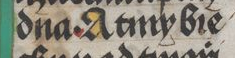dna.A tmy bie¬
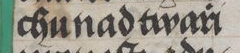chu nad twaṙí
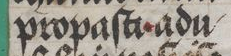propaſti.adu¬
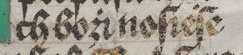ch bożi noſieẛe
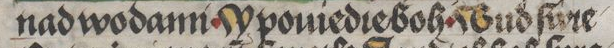nad wodamí. Y pouídieboh.Bud ſwie¬
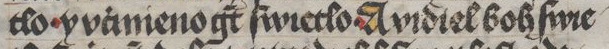tlo.y vċinieno ḡt ſwietlo.A vidiel bohſwie¬
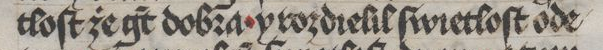tloſt że ḡt dobra.y rozdielil ſwietloſt ode¬
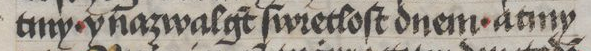tmy.y nazwal ḡt ſwietloſt dnem.a tmy
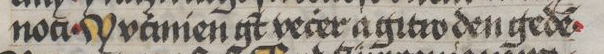noci.Y vċiníen ḡt veċer a gitro den gedē.
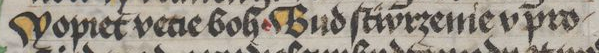Vopiet vecie boh.Bud stwrzenie v pro¬
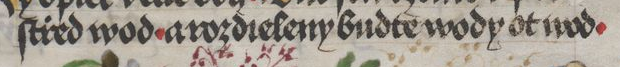ſtṙed wod.a rozdieleny budte wody ot wod.
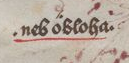.neb obloha.
